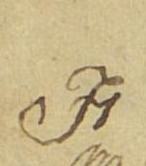F
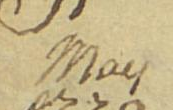May
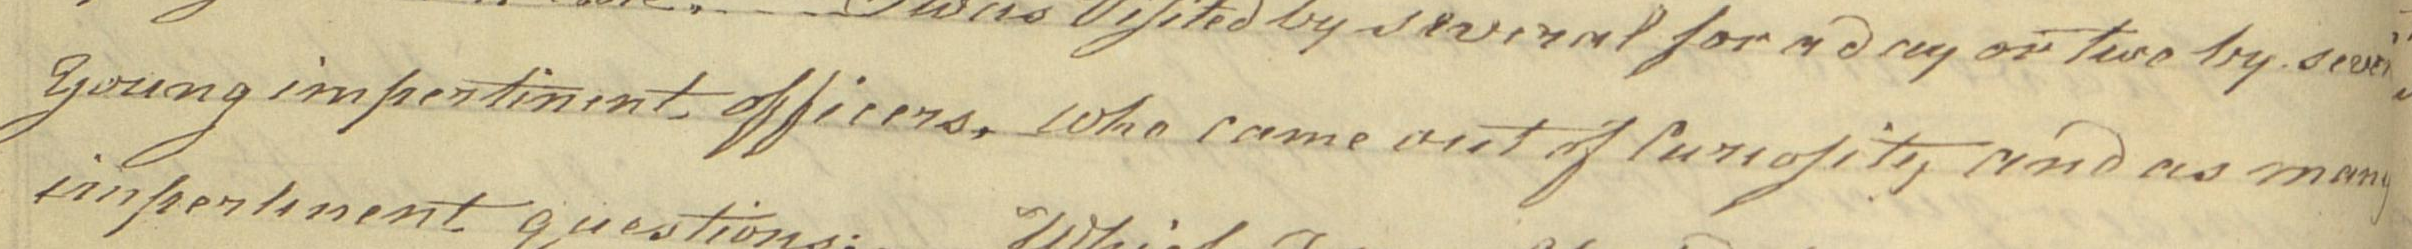Young impertinent officers, who came out of Curiosity and as many
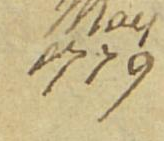1779
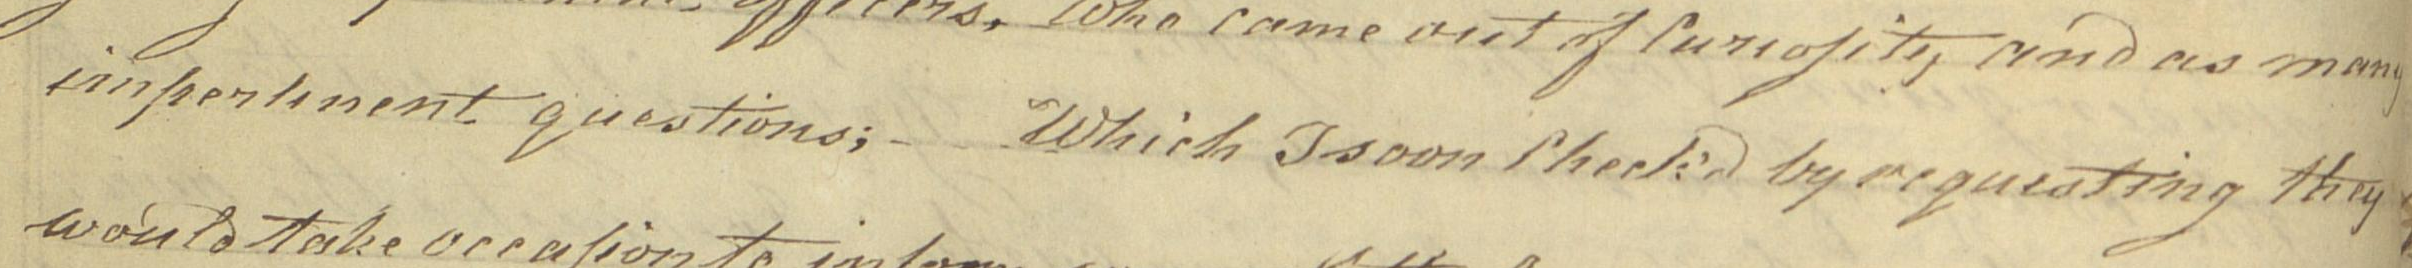impertinent questions; Which I soon check'd by requesting they
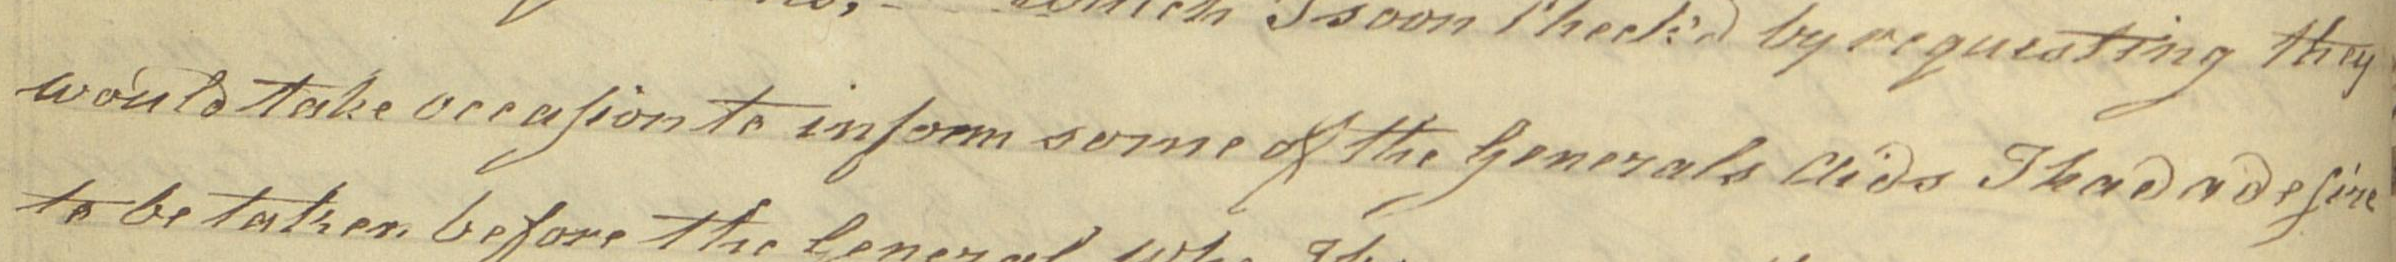would take occassion to inform some of the Generals Aids I had a desire
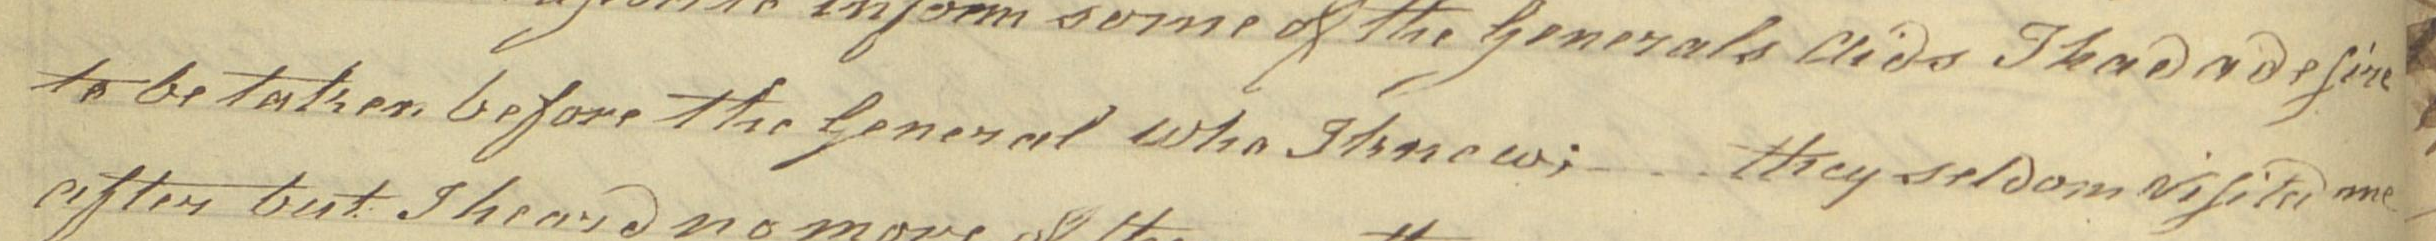to be taken before the General who I knew;. they seldom visited me
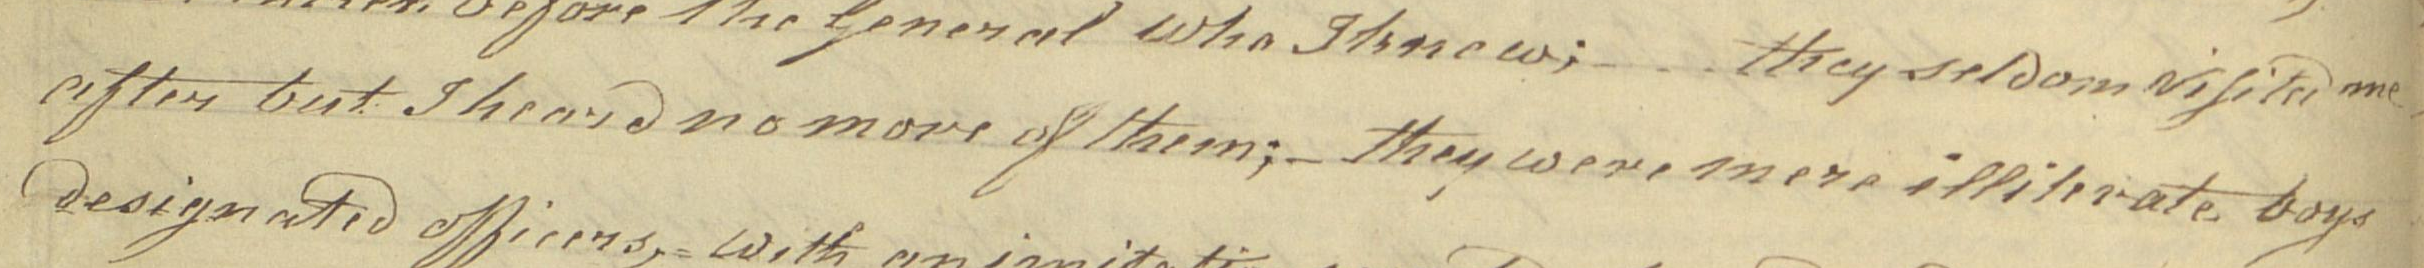after but I heard no more of them; they were mere illiterate boys
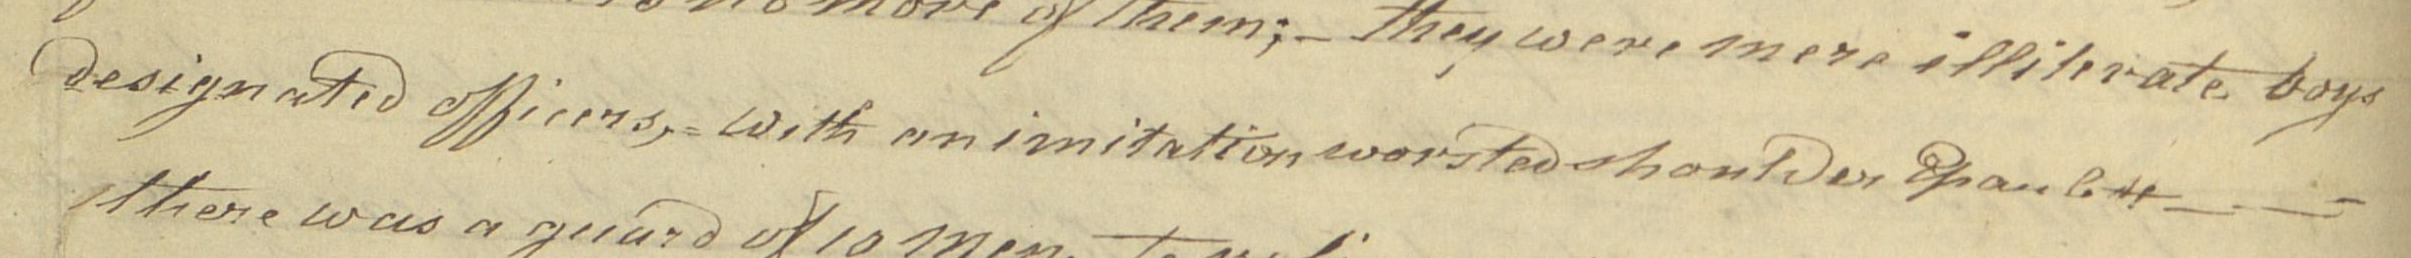designated officers With an imitation worsted shoulder Epaulett.
